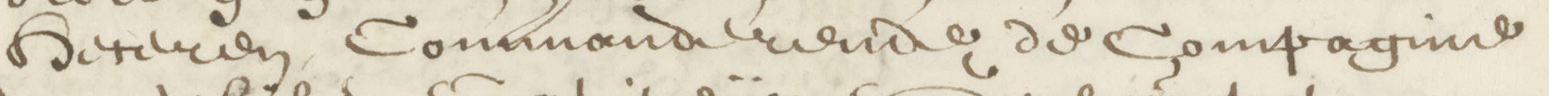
Heteren Commanderende de Compagnie
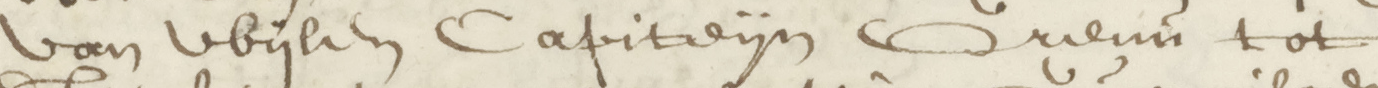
van Wijlen Capiteijn Grenu tot
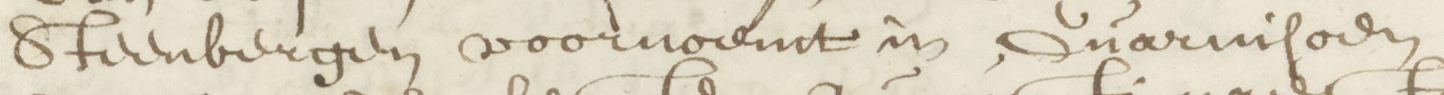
Steenbergen voornoemt in Guarnisoen
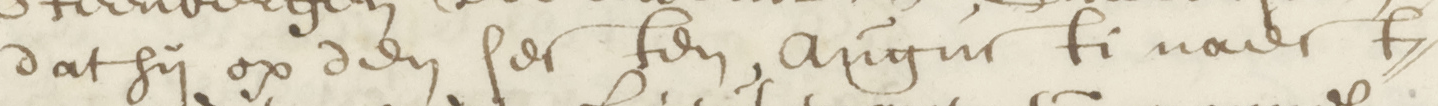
dat hij op den sesten Augusti naest„
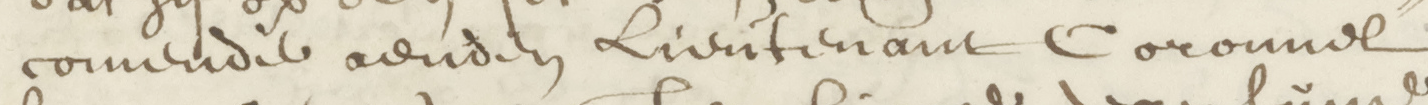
comende aenden Lieutenant Coronnel
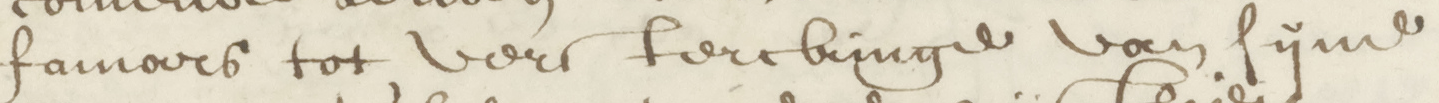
famars tot versterckinge van sijne
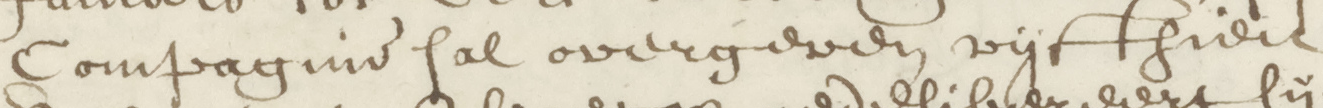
Compagnie sal overgeven vijfthien
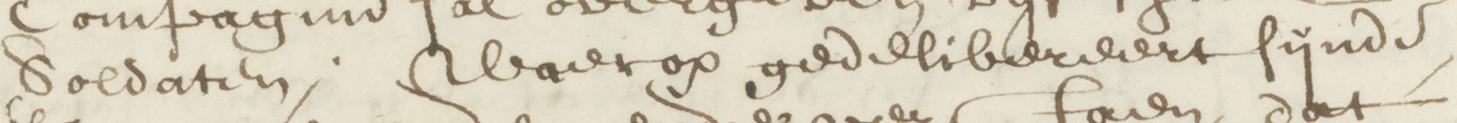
Soldaten, Waerop gedelibereert sijnde
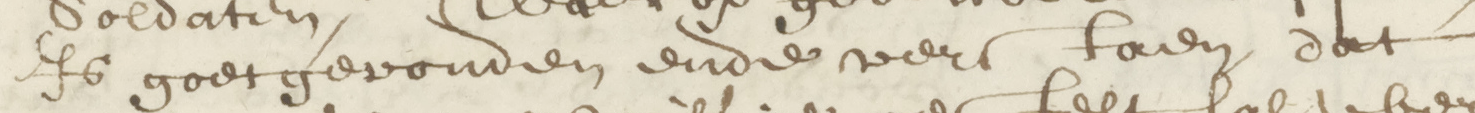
Is goetgevonden ende verstaen dat
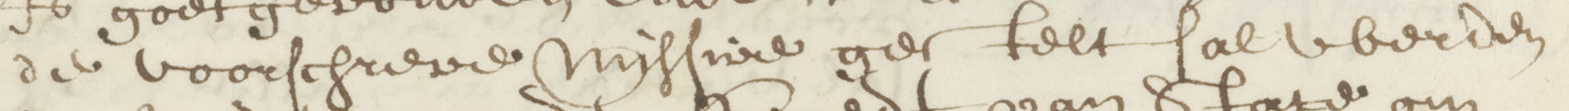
de voorschreve Missive gestelt sal werden
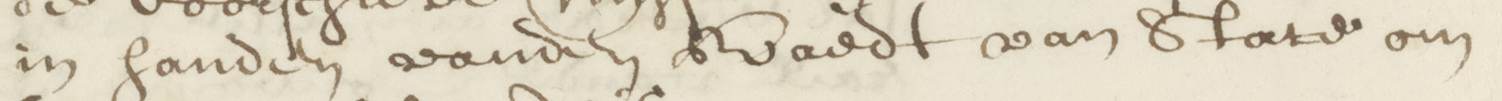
in handen vanden Raedt van State om
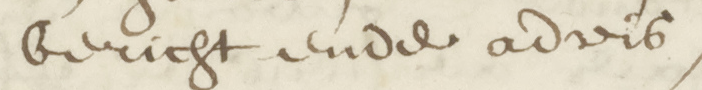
bericht ende advis.
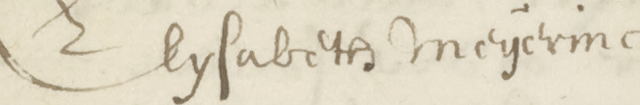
Elysabeth meijerincx
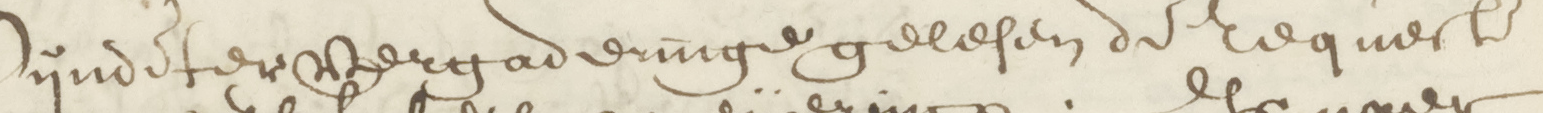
Sijnde ter Vergaderinge gelesen de requeste
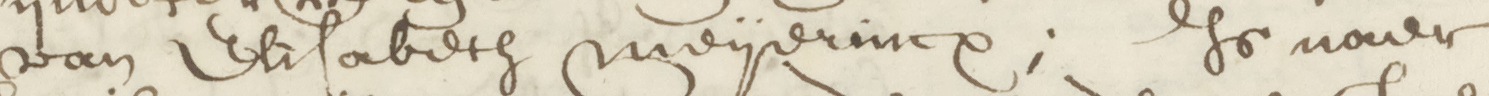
van Elisabeth Meijerincx; Is naer
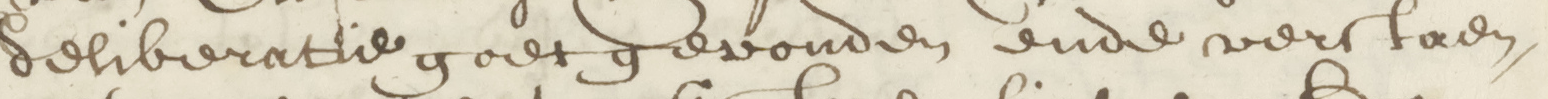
deliberatie goetgevonden ende verstaen,
